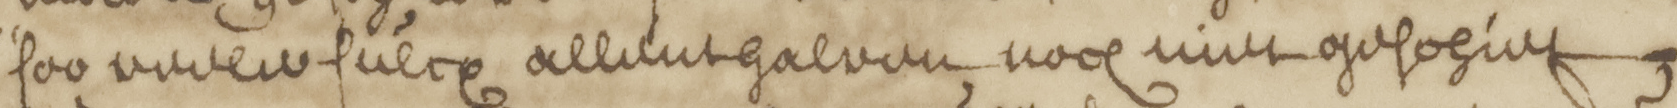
soo veele sulcx allenthalven noch niet geschiet
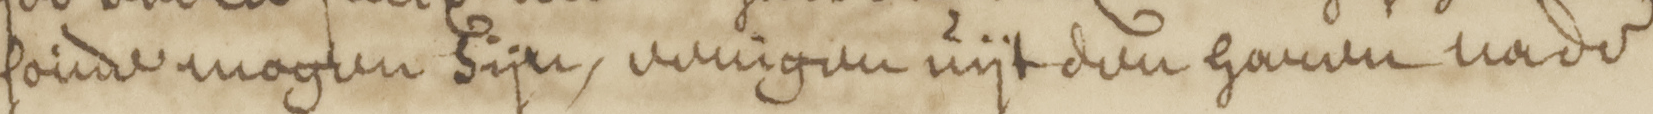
soude mmogen sijn, eenigen uijt den haren nade
